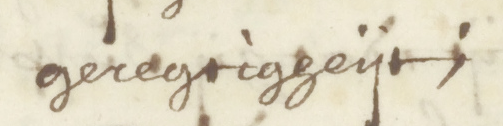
geregtigheijt;
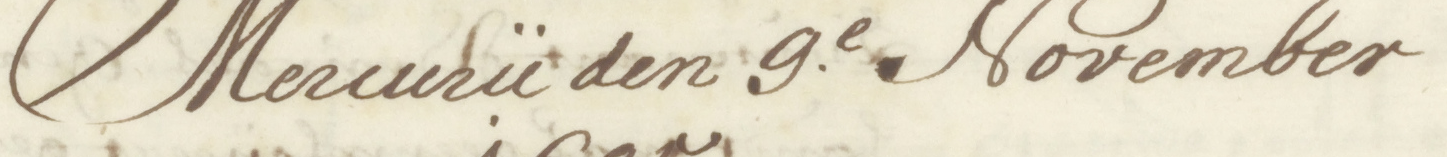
Mercurie den 9e. November
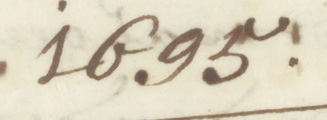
1695.
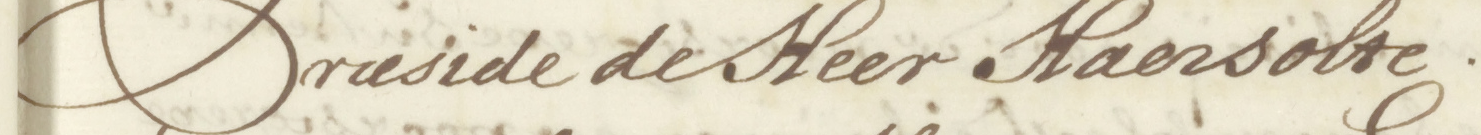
Præside de Heer Haersolte
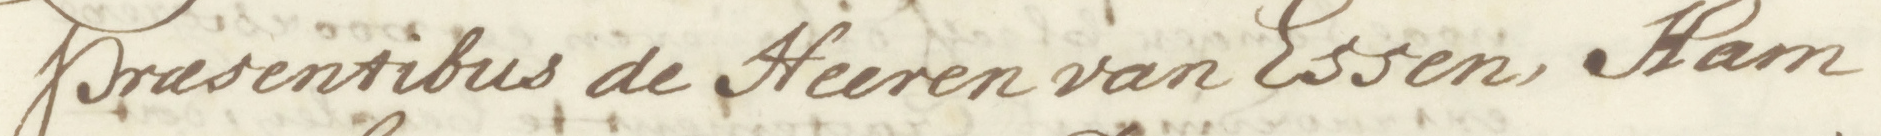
Præsentibus de Heeren van Essen, Ham
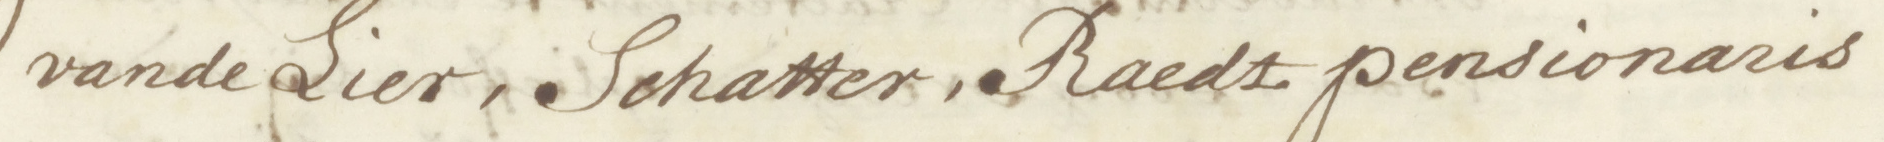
vande Lier, Schatter, Raedt pensionaris
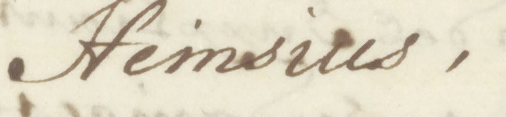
Heinsius.,
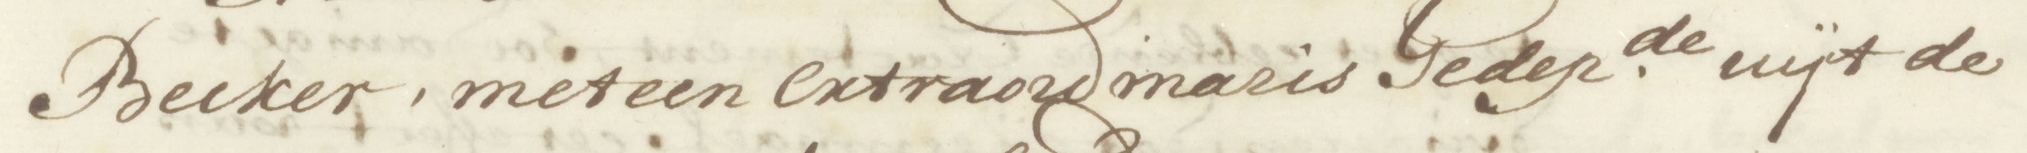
Becker, met een extraordinaris Gedepde. uijt de
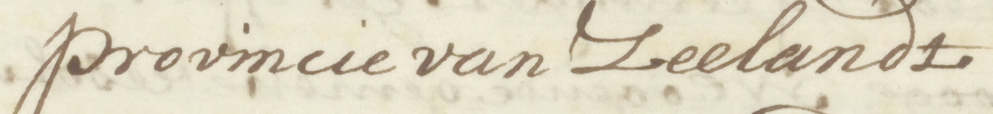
Provincie van Zeelandt
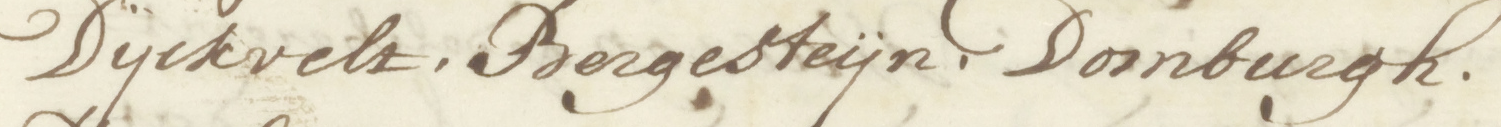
Dijckvelt, Bergesteijn Domburgh.
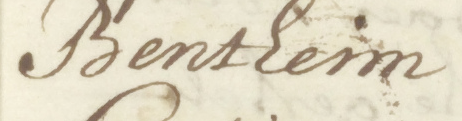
Bentheim
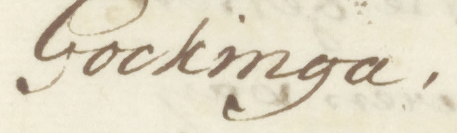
Gockinga.
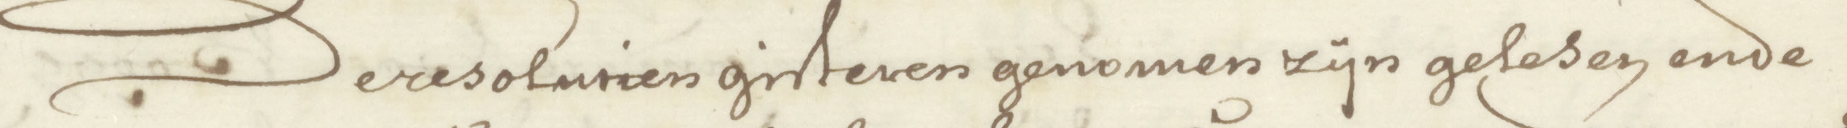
De resolutien gisteren genomen zijn gelesen ende
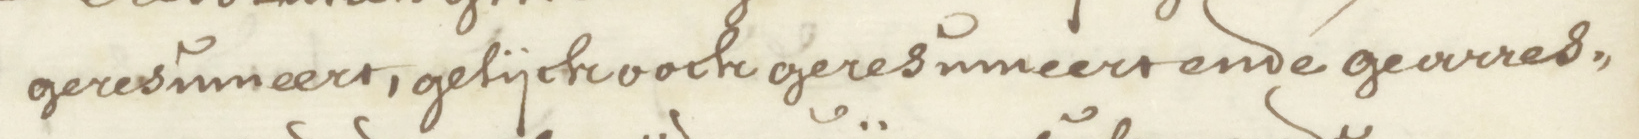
geresumeert, gelijck oock geresumeert ende gearres„
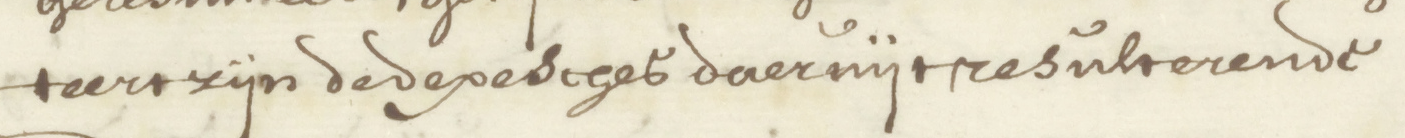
teert zijn de depesches daeruijt resulterende
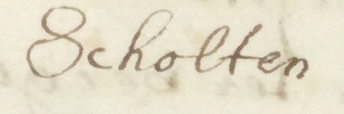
Scholten
